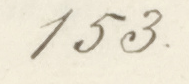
153.
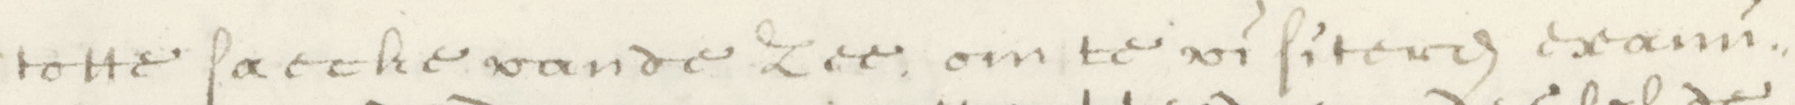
totte saecke vande Zee, om te visiteren exami,,
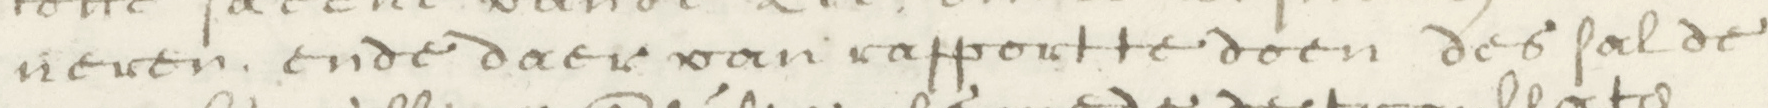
neren, ende daer van rapport te doen des sal de
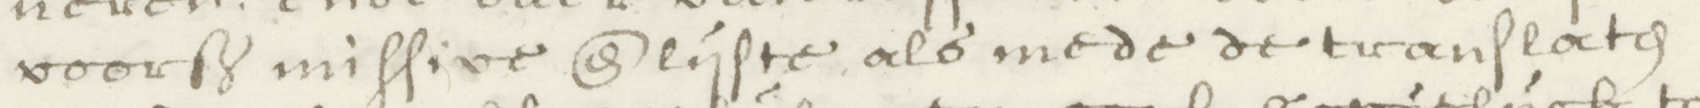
voors missive & lijste als mede de translaten
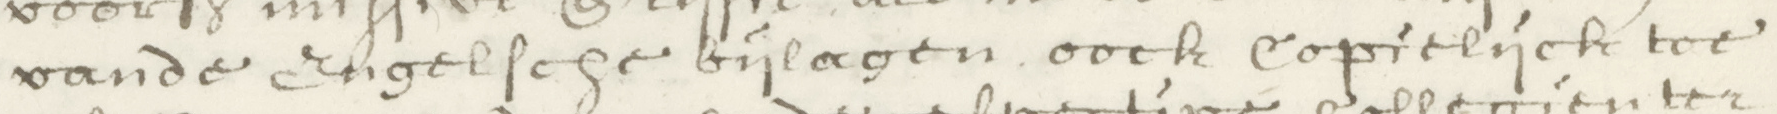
vande Engelsche bijlagen, oock copielijck toe
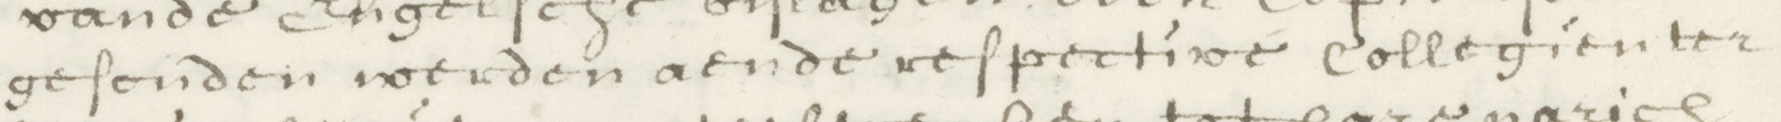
gesonden werden aende respective Collegien ter
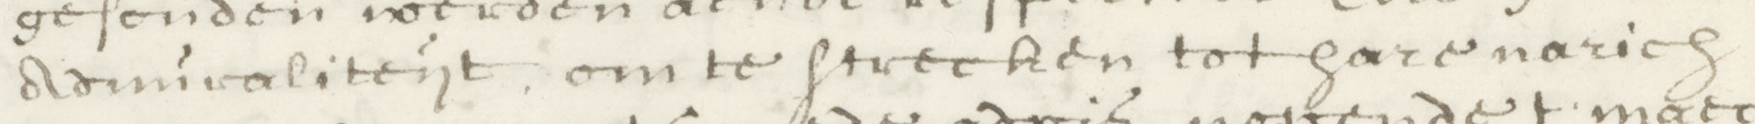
Admiraliteijt, om te strecken tot hare narich
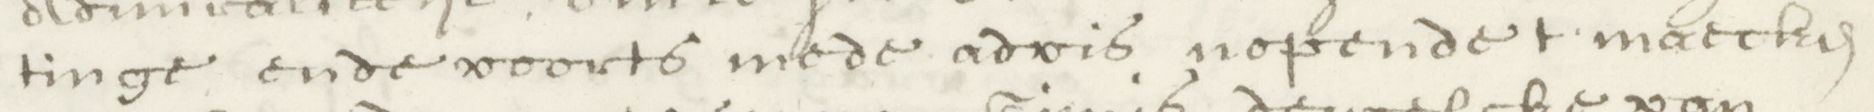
tinge ende voorts mede advis nopende t‛maecken
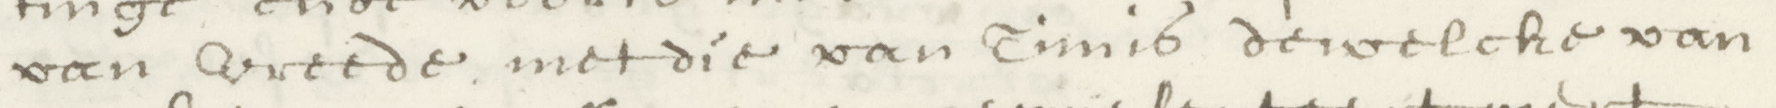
van Vreede, met die van Tunis dewelcke van
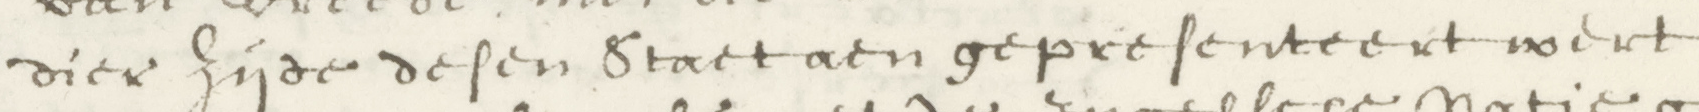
dier zijde desen Staet aen gepresenteert wert,
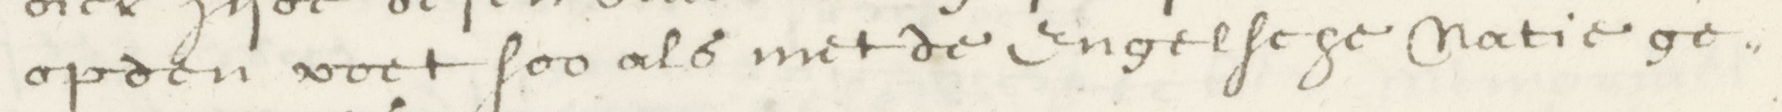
opden voet soo als met de Engelsche Natie ge,,
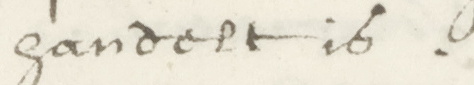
handelt is.
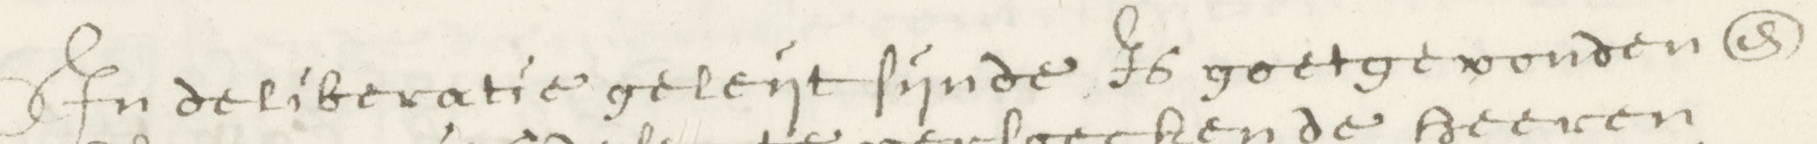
In deliberatie geleijt sijnde, Is goetgevonden &
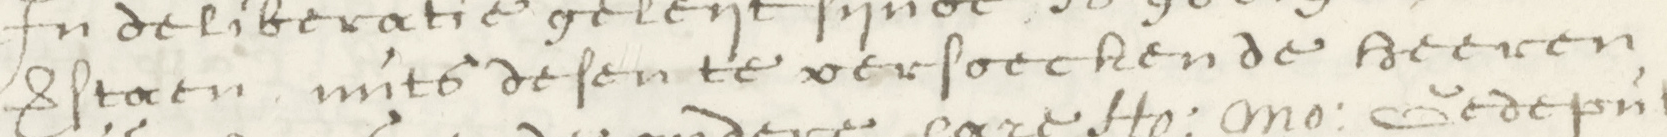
vstaen, mits desen te versoecken de heeren
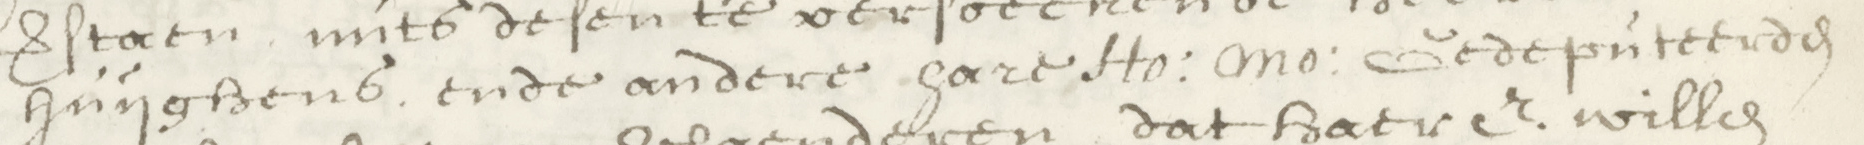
huijghens ende andere hare Ho:Mo: Gedeputeerden
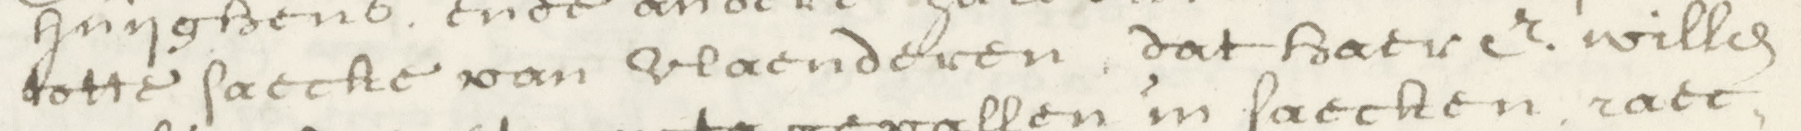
totte saecke van Vlaenderen, dat haer E. willen
